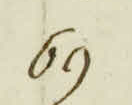69
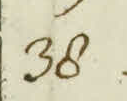38
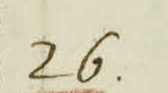26.
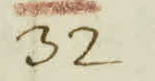32
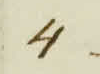4
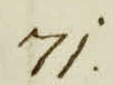71
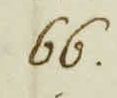66
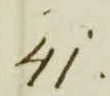41
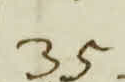35
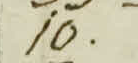10.
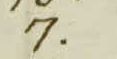7.
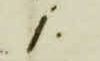1.
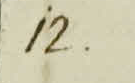12.
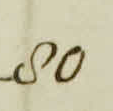80
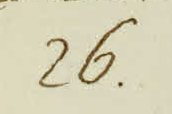26.
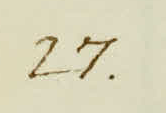27.
